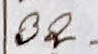32
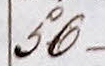56
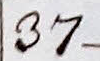37
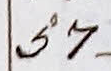57
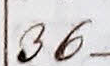36
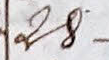28
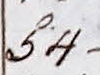54
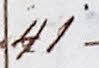41
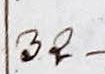32
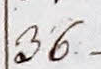36
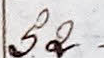52
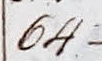64
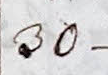30
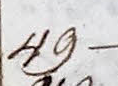49
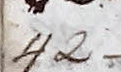42
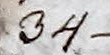34
